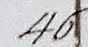46
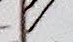1
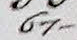61
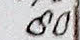80
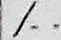1.
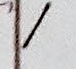1
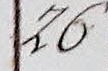26
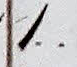1.
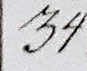34
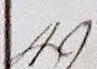49
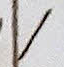1
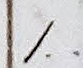1.
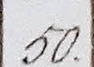50.
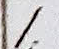1
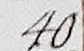40
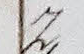2
